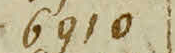6910
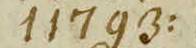11793
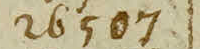26507
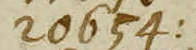20654
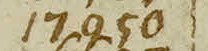17950
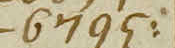6795
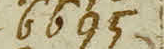6695
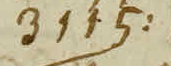3115
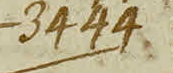3444
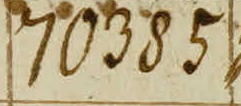70385
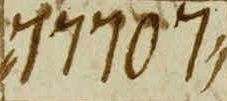77707
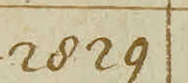2829
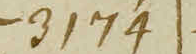3174
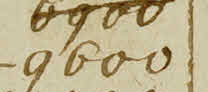9600
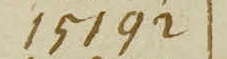15192
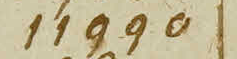11990
